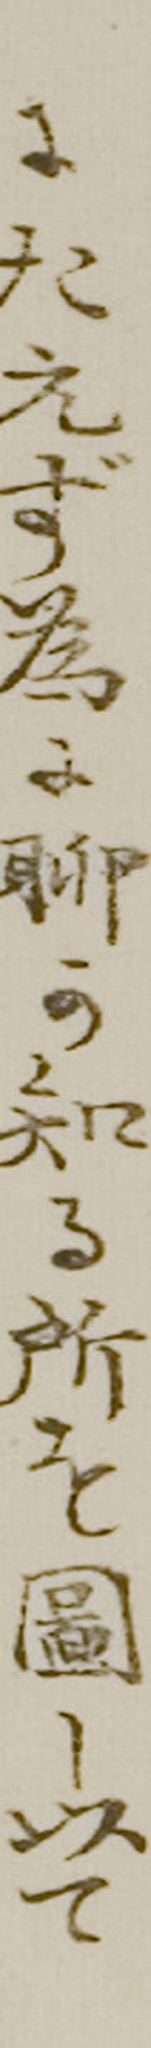にたえず為に聊か知る所を図し以て
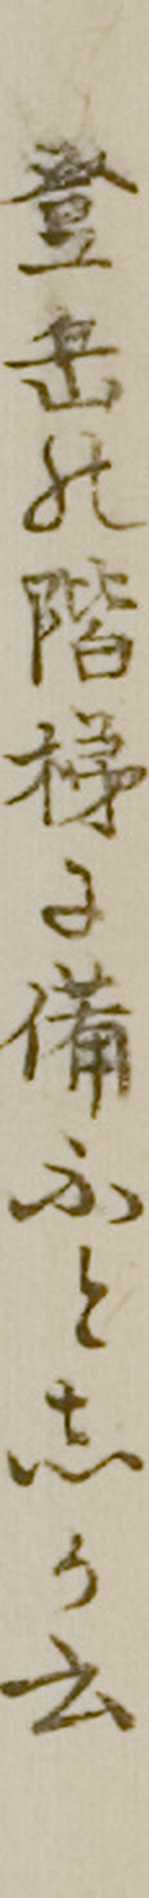登岳の階梯に備ふとしか云
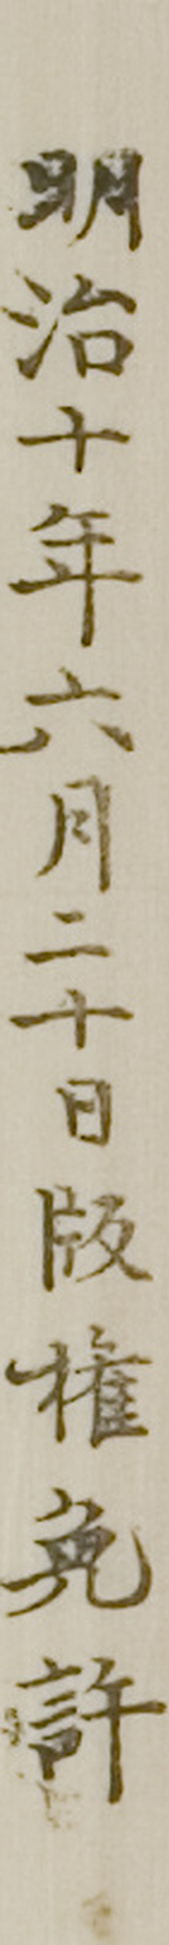明治十年六月二十日版権免許
